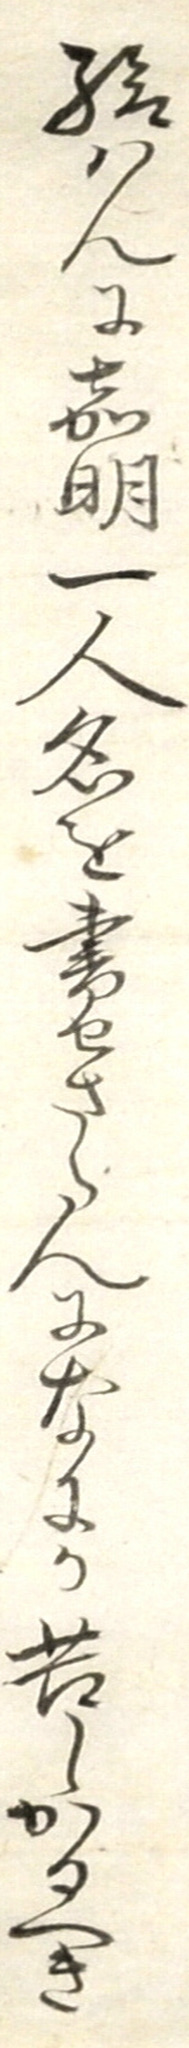給はんに嘉明一人名を書せさらんになにか苦しかるへき
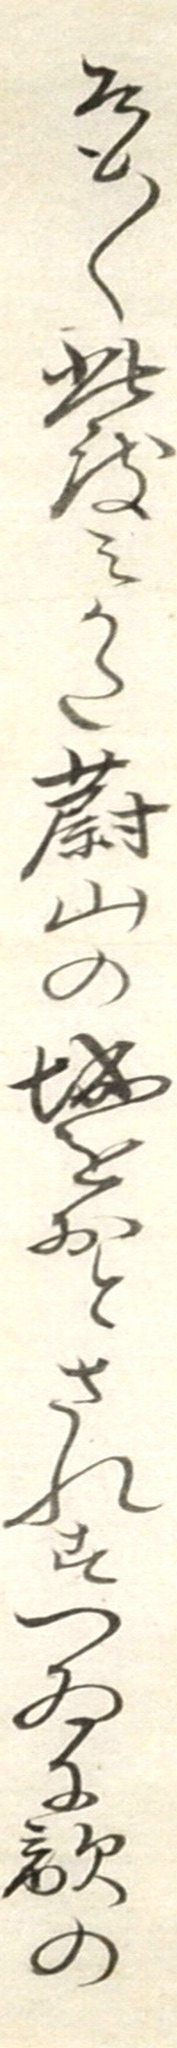そも〳〵此度みかた蔚山の城をおとされすつゐに敵の
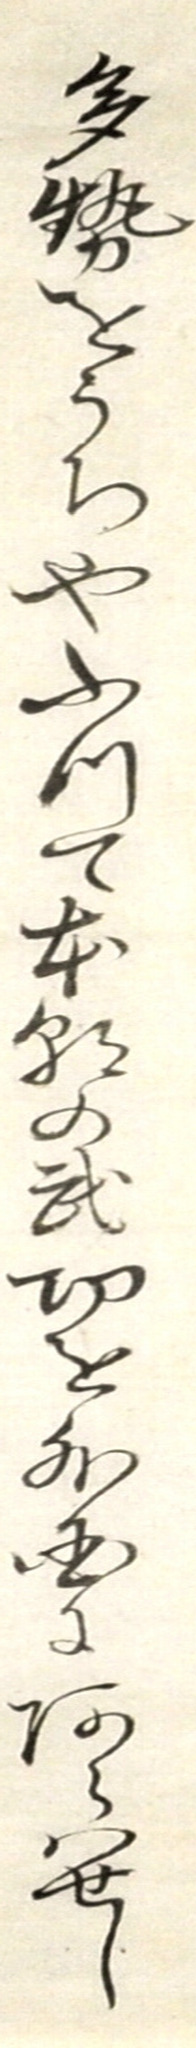多勢をうちやふつて本朝の武功を外国にあらはせし
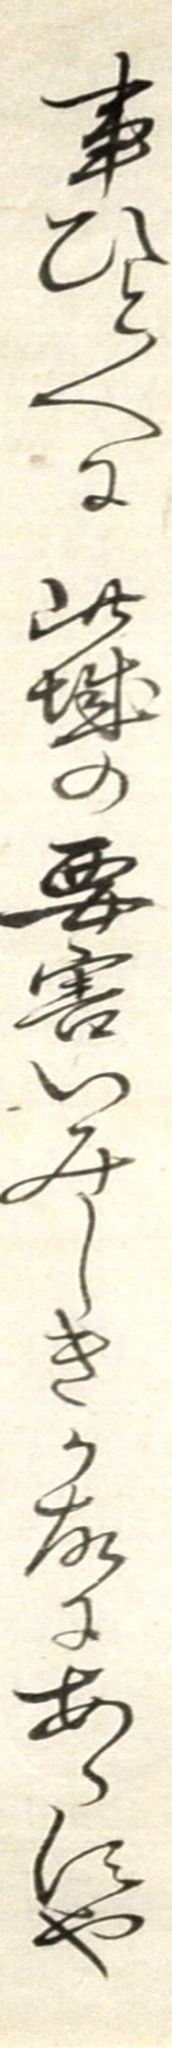事ひとへに此城の要害いみしきか故にあらすや
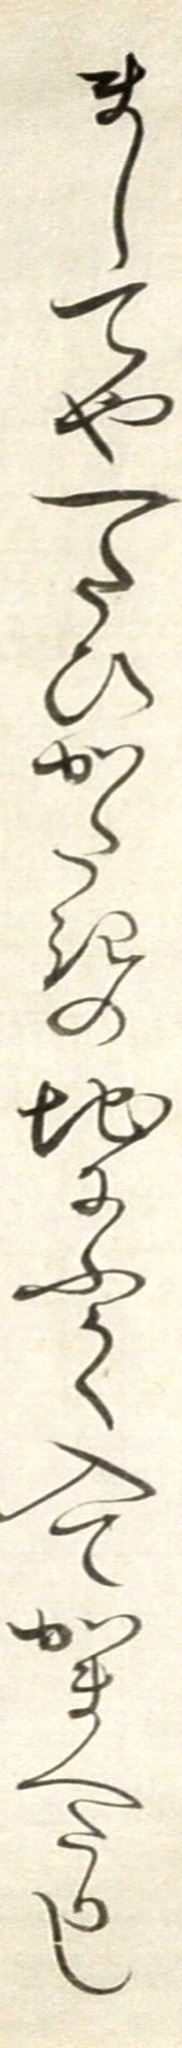ましてや一たひかたきの地にふかく入てかまへたりし
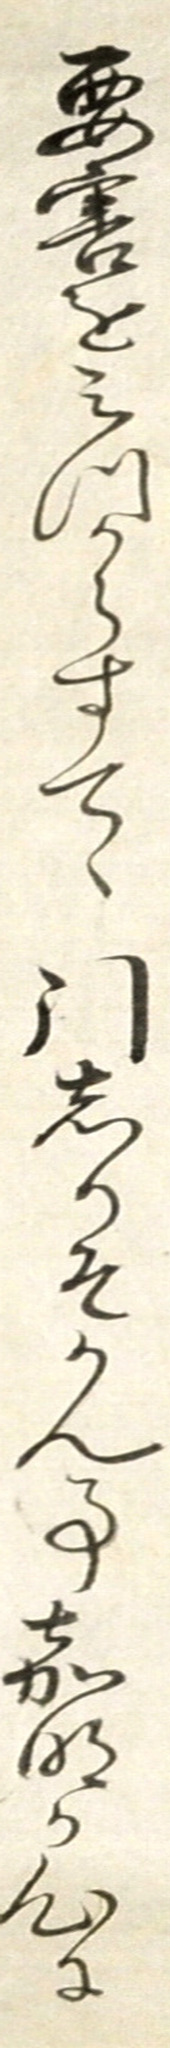要害をみつからすてゝ引しりそかん事嘉明か心に
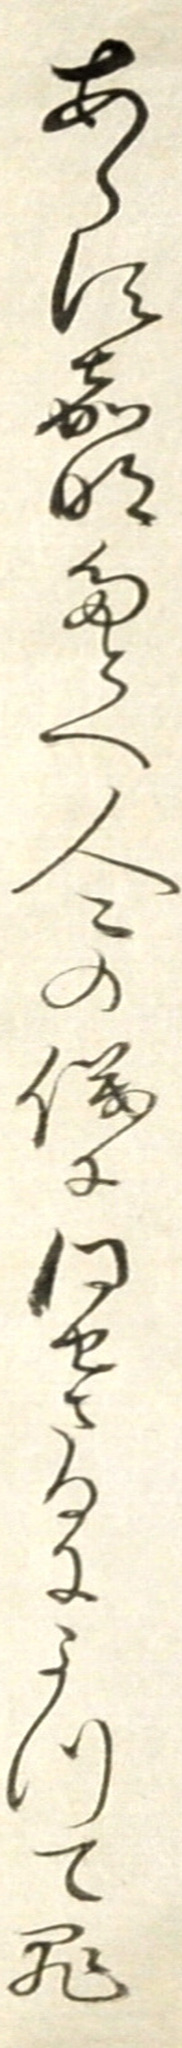あらす嘉明たとへ人々の儀に同せさるによつて罪
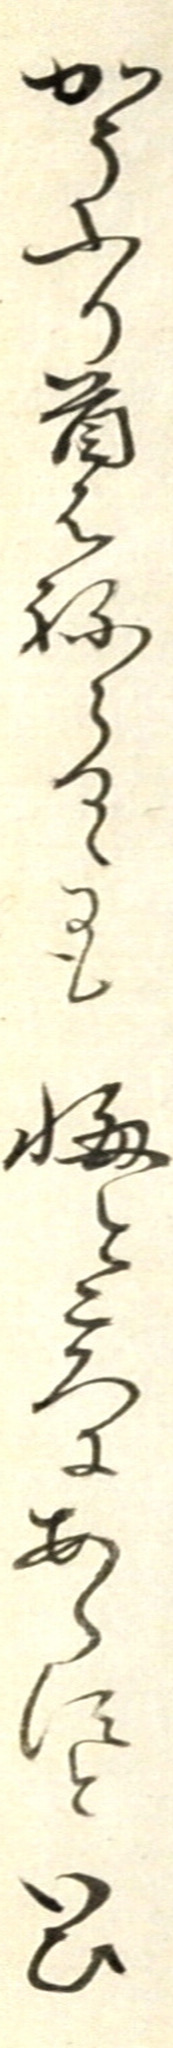かうふり首はねらるゝにも悔ところにあらすといひ

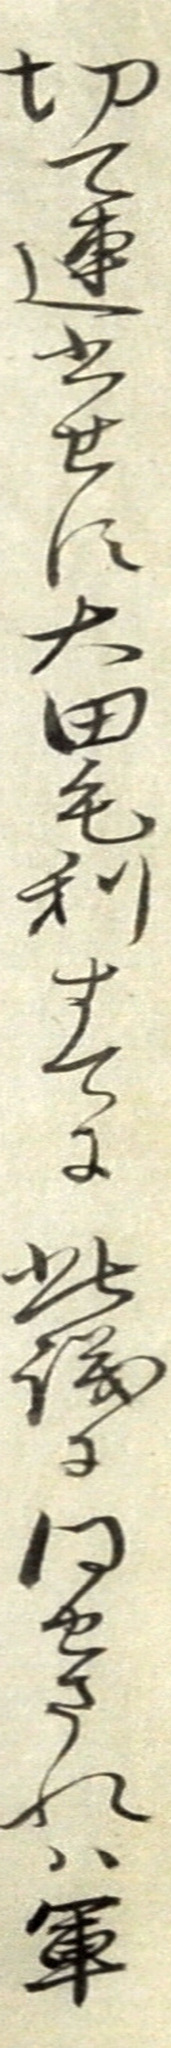切て連書せす大田毛利すてに此儀に同せされは軍
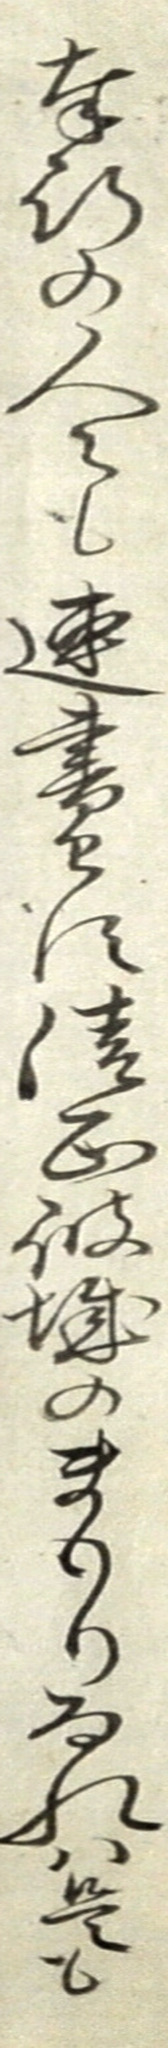奉行の人々も連書せす清正彼城のまもりなれは是も
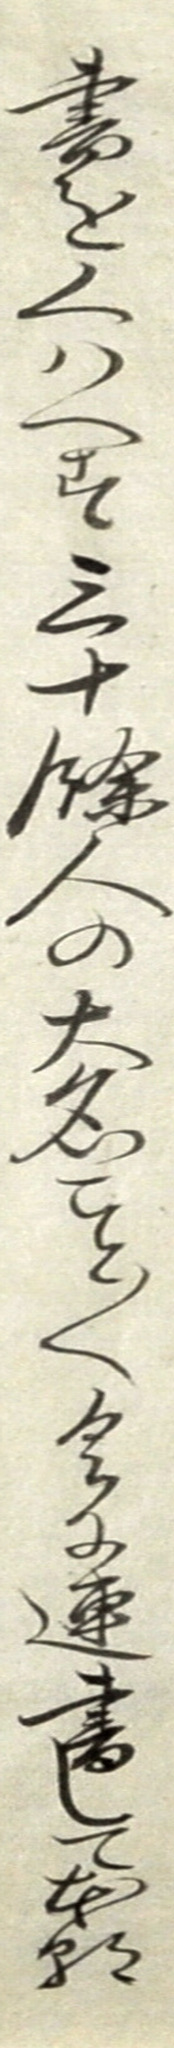書をくはへす三十余人の大名こと〳〵くに連書して本朝
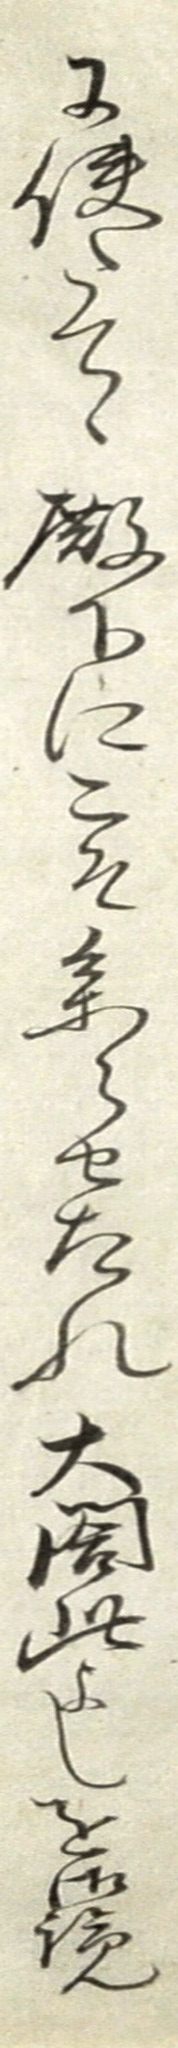に使たてゝ殿下にこそ参らせたれ太閤此よしを御覧
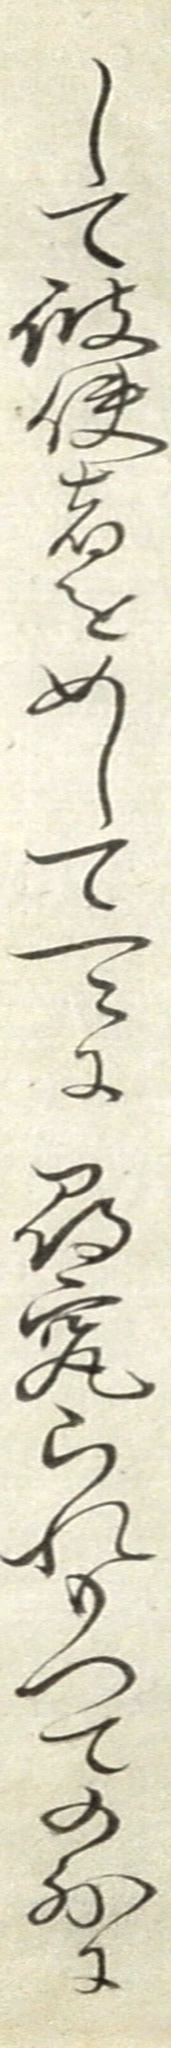して彼使者をめして一々に尋究られもつての外に
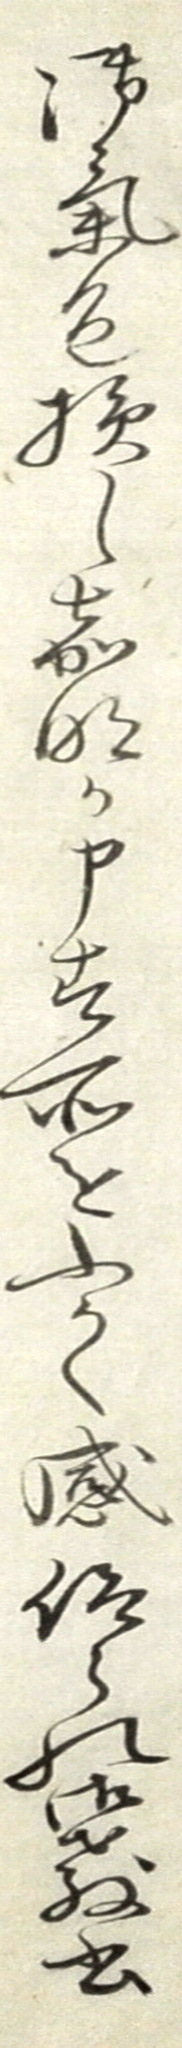御気色損し嘉明か申す所をふかく感仰られ御教書
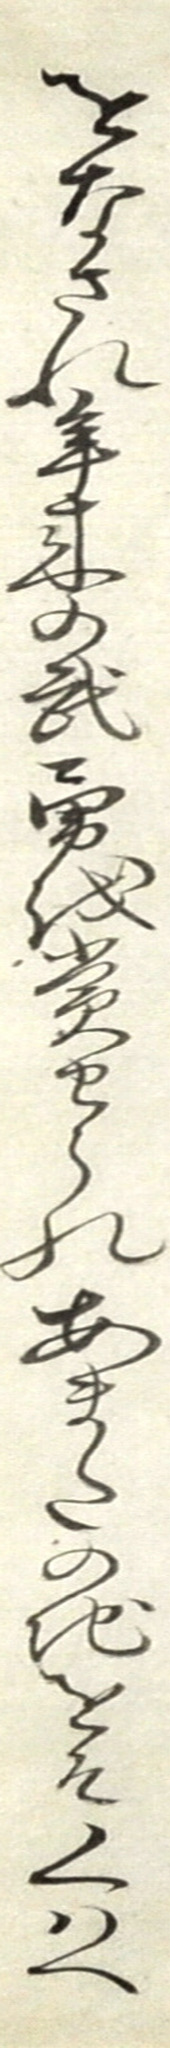をなされ年来の武勇を賞せられあまたの地をそくはへ
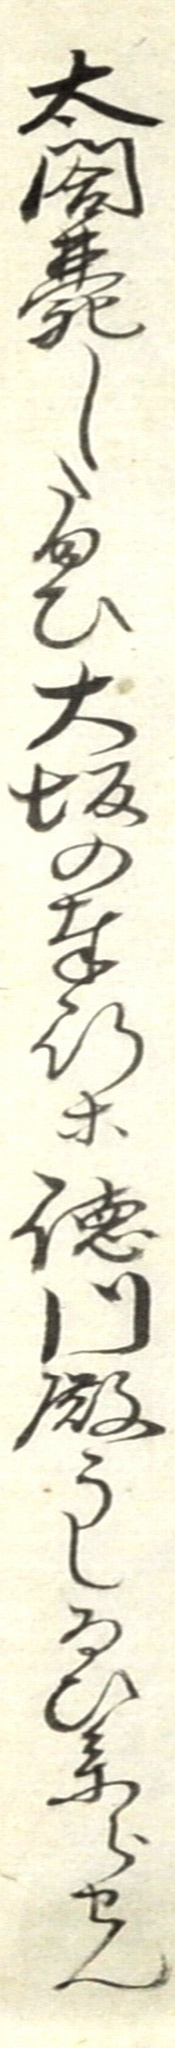太閤薨したまひ大坂の奉行等徳川殿うしなひ参らせん
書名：藩翰譜（七・下）
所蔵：伊那市立高遠町図書館・合同会社AMANE
